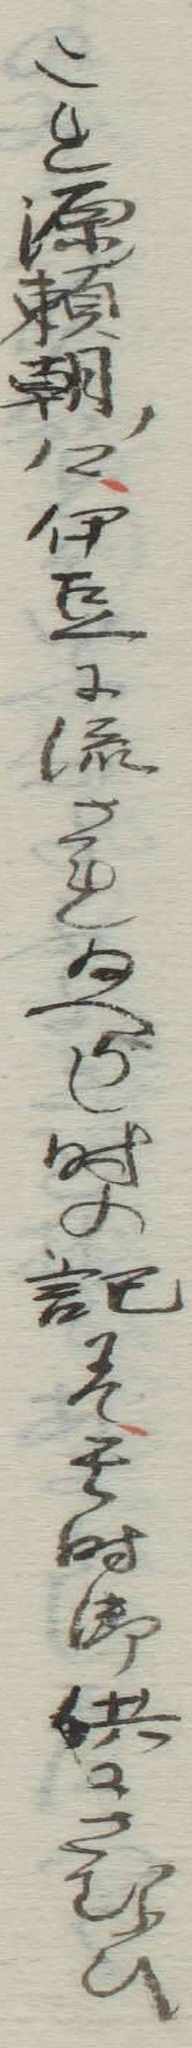これ源頼朝卿、伊豆に流され給へりし時の記にて其時御供にさむらひ
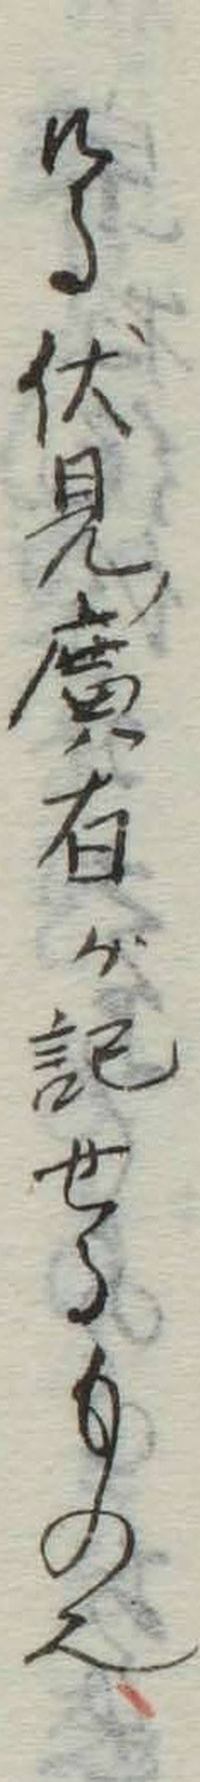ける伏見廣有が記せるもの也、
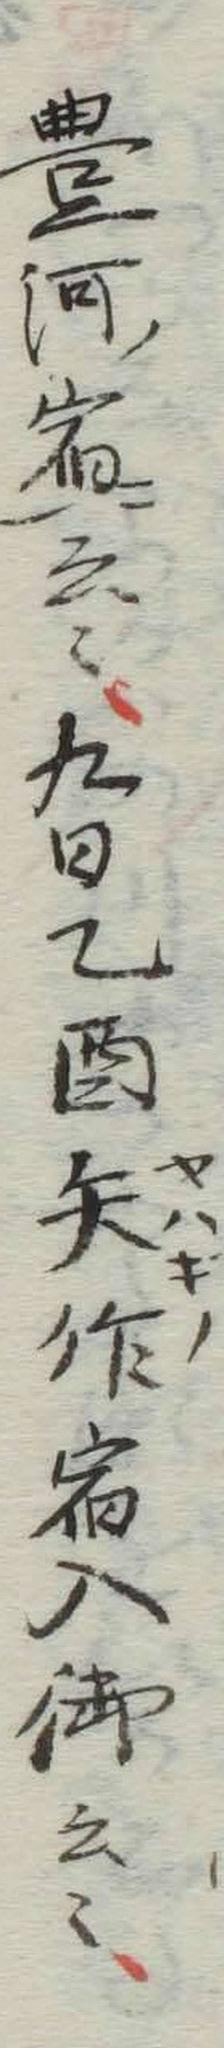豊河宿云々、九日乙酉矢作宿入御云々、
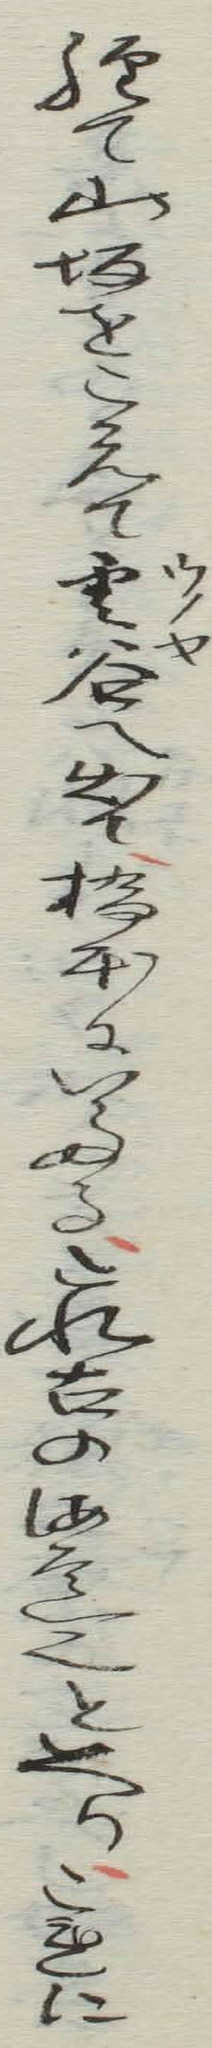経て山坂をこえて雲谷へ出て、橋本にいたる、これ古の海道也といへり、これに
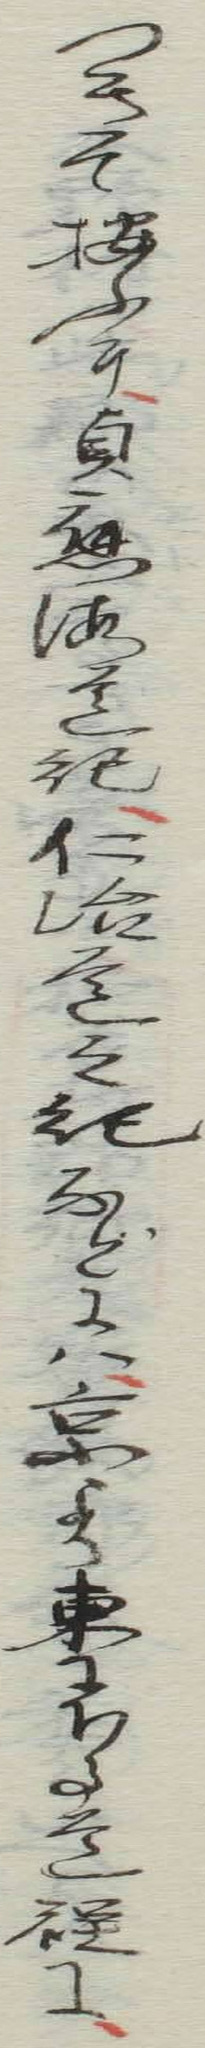つきて按ふに、貞応海道記、仁治道之記などには、京より東に下る道程に、
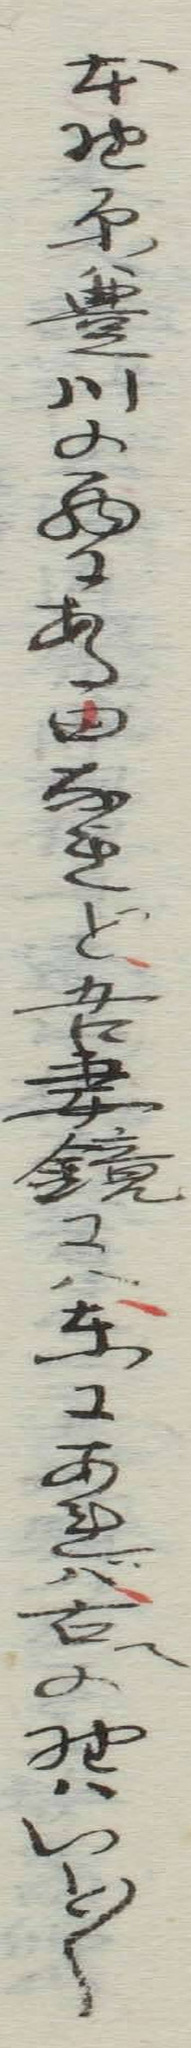本野原は豊川の西にある由なれど吾妻鏡には、東にあれば、古への野はいと〳〵
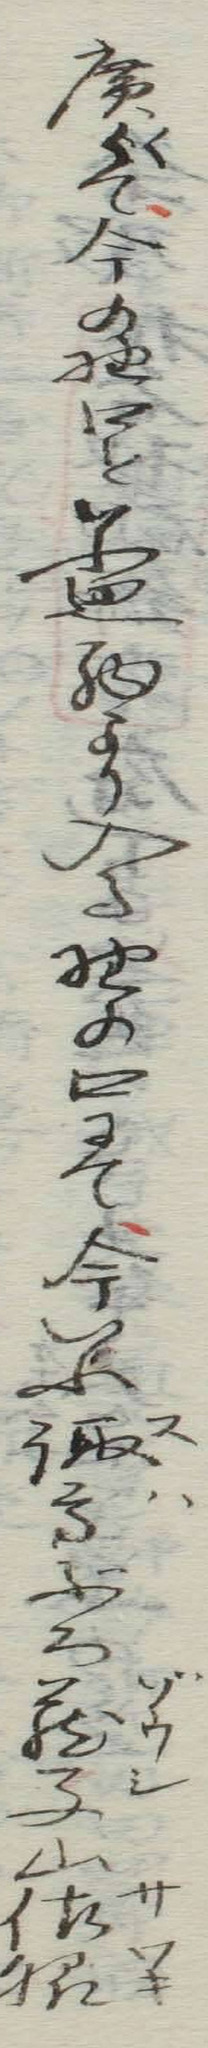広くて、今の野口といふ辺西より入る野の口にて、今いふ諏方ぶろ蔵子山佐脇
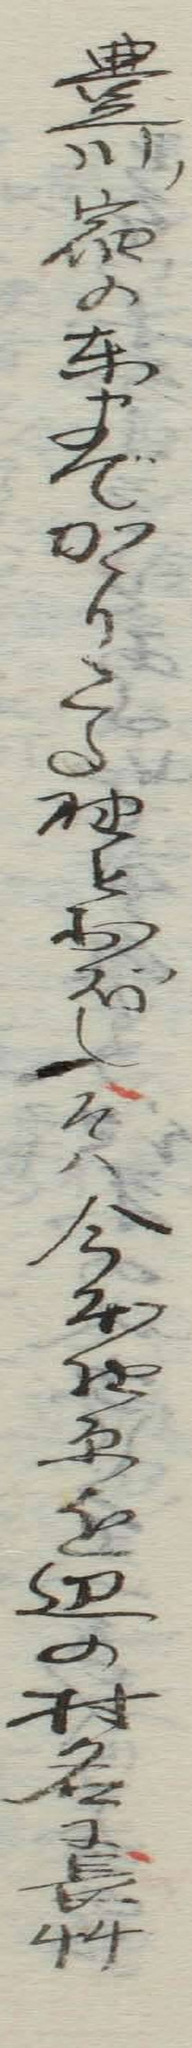豊川宿の東までかゝりたる野とおぼし、そは今本野原近辺の村名に、長艸
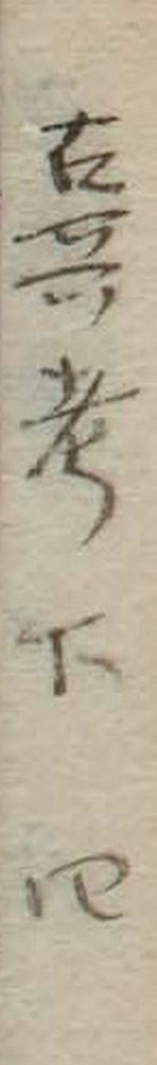古歌考下四

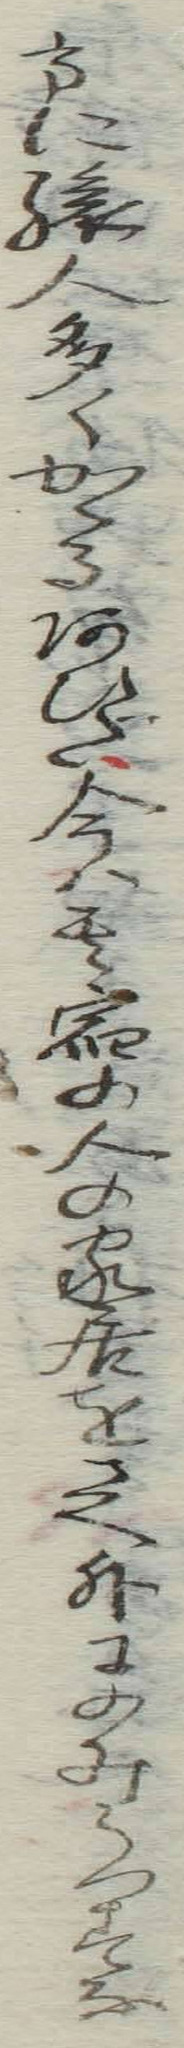方に旅人多くかゝるあひだ、今は其宿の人の家居をさへ外にのみうつすな
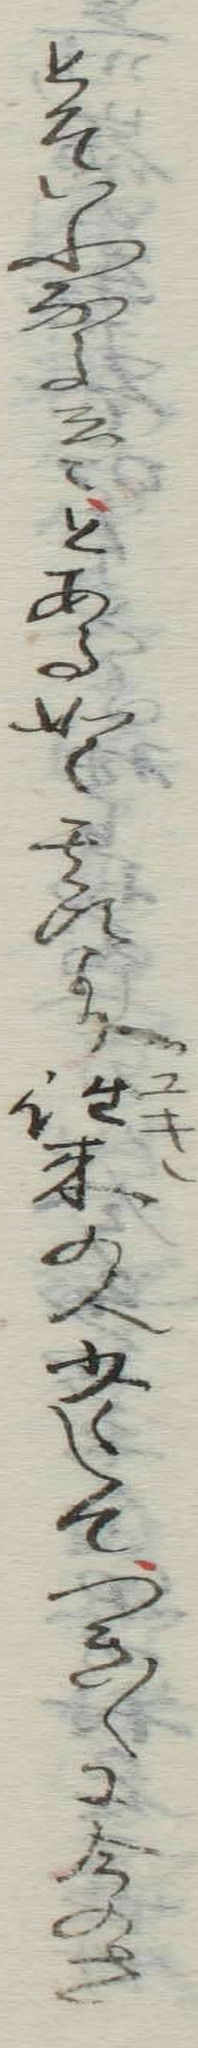とそいふなる云々、とある如く其頃より往来の人少くして、つき〳〵に今のさ
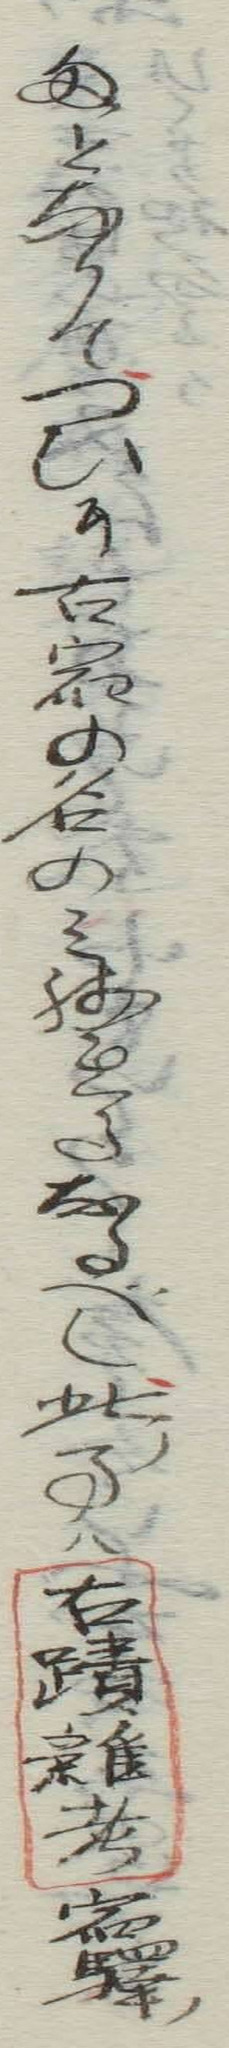まとなりて、つひに古宿の名のみ残れるなるべし、此事は古蹟雑考宿駅
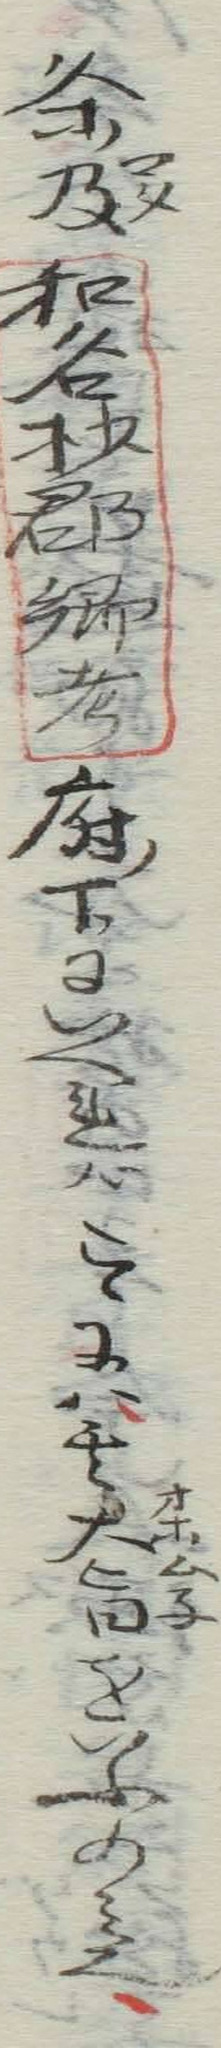条及和名抄郡郷考府下にいへればこゝには、其大旨をいふのみ也、
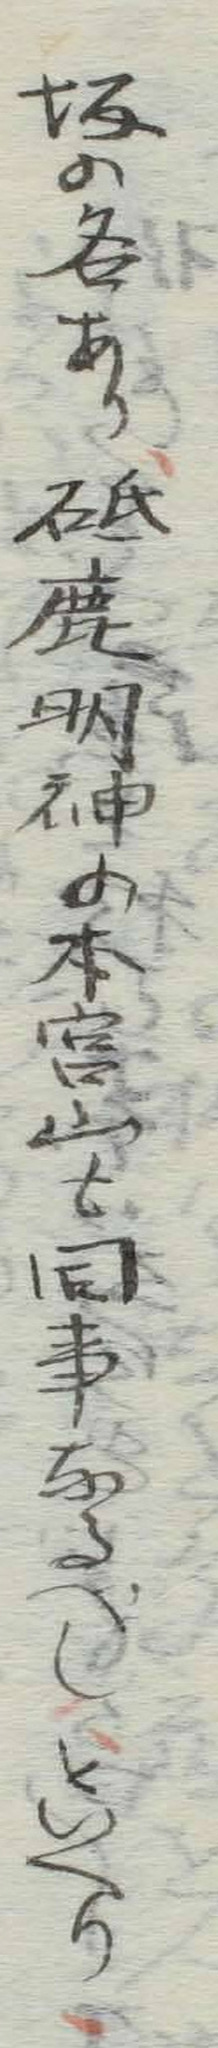坂の名あり、砥鹿明神の本宮山も同事なるべし、といへり、
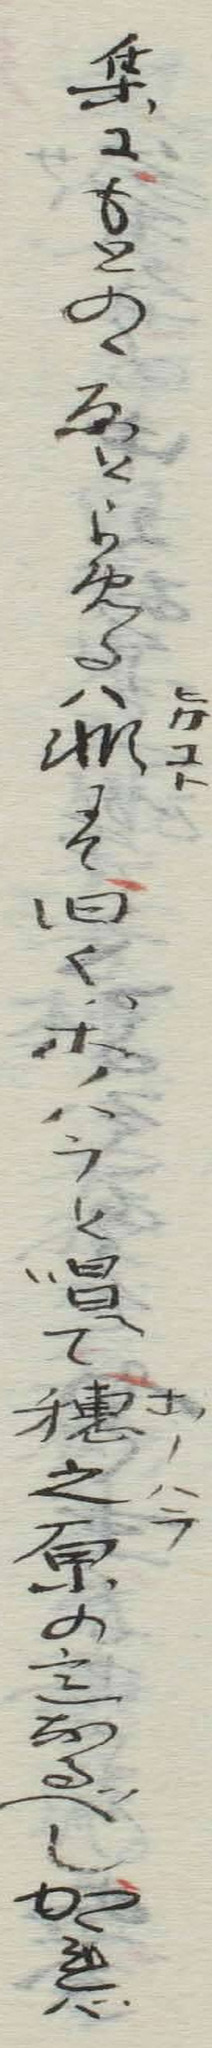集にもとのゝ原とよめるは非にて、旧く。ホノハラと唱へて、穂之原の意なるべしかゝれば
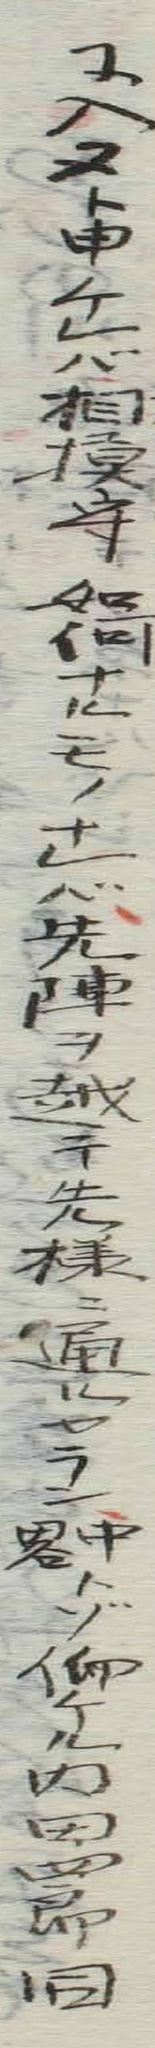に入ヌト申ケレバ相模守如何ナルモノナレバ、先陣ヲ越テ先様ニ通ルヤラン中略トゾ仰ケル内田四郎同
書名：三河国古跡考
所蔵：国文学研究資料館
